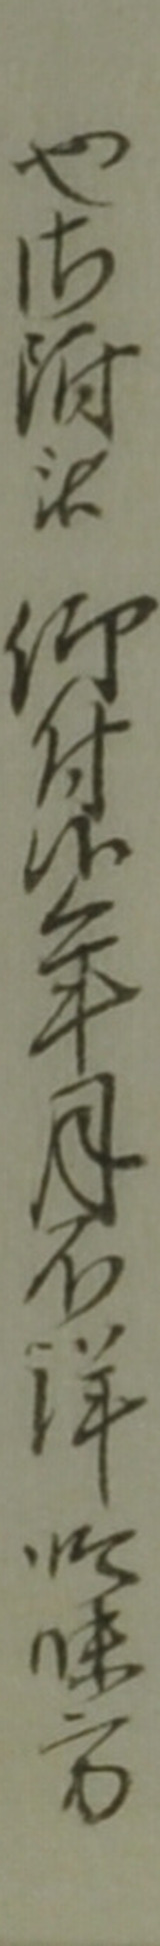や御附被仰付候年月不詳吟味方
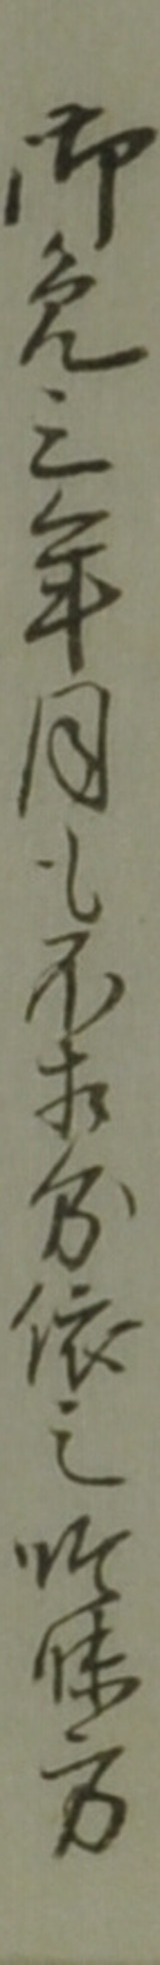御免之年月も不相分依之吟味方
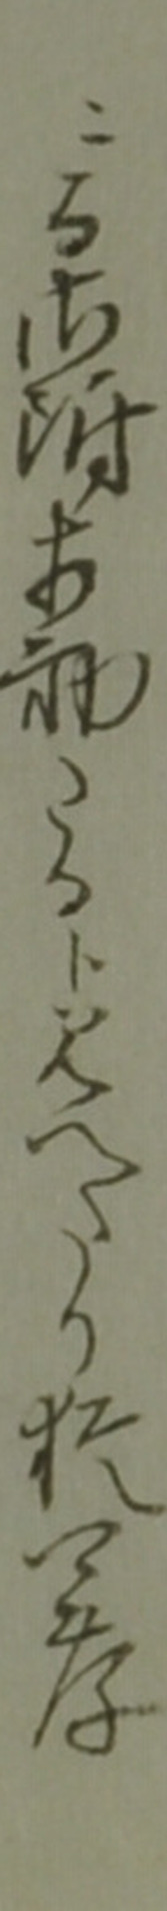にて御附相勤たると見えたり猶可孝
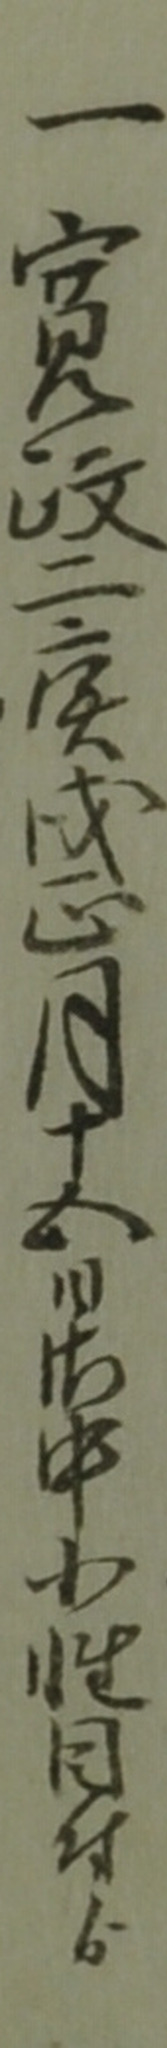一寛政二庚戌正月十五日御中小姓目付より
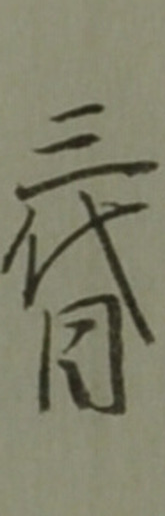三代目
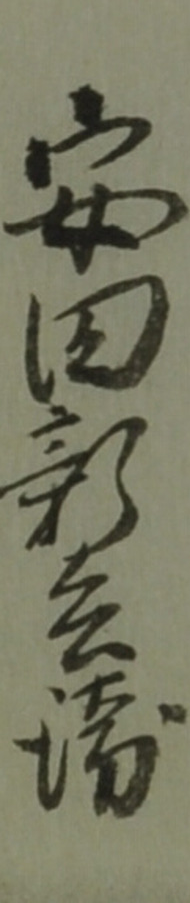安田新兵衛
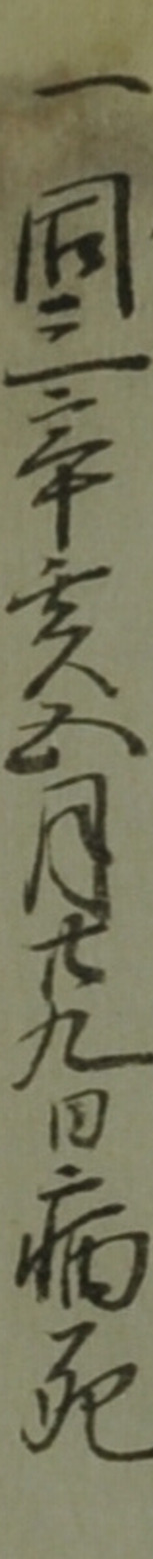一同三辛亥五月廿九日病死
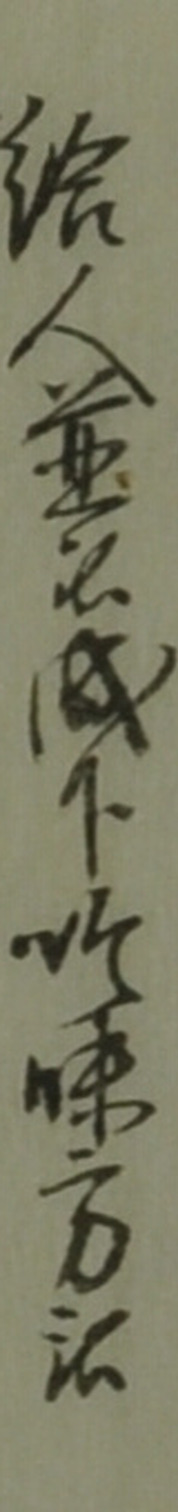給人並被成下吟味方被
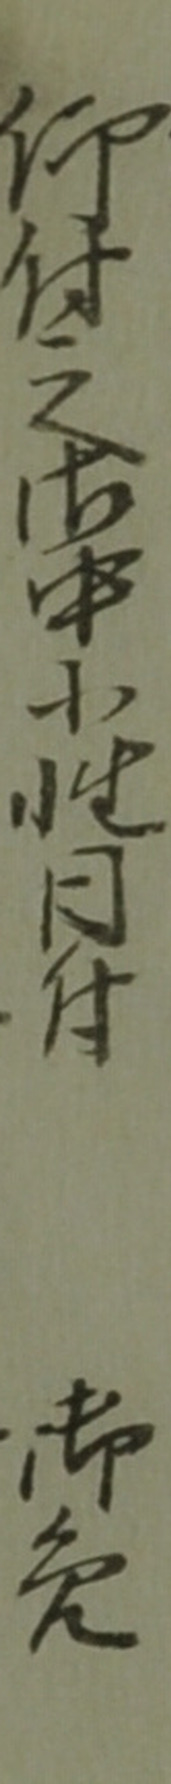仰付之御中小姓目付御免
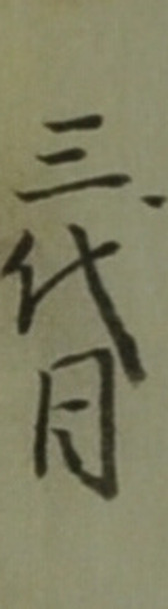三代目
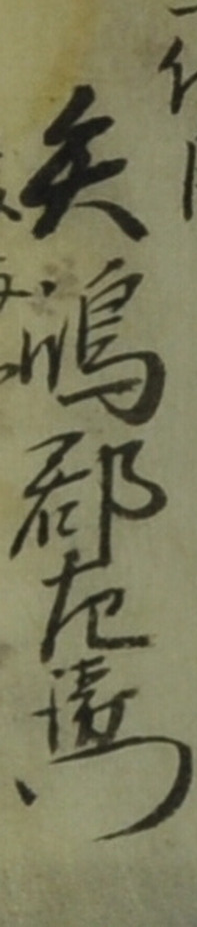矢嶋郡左衛門
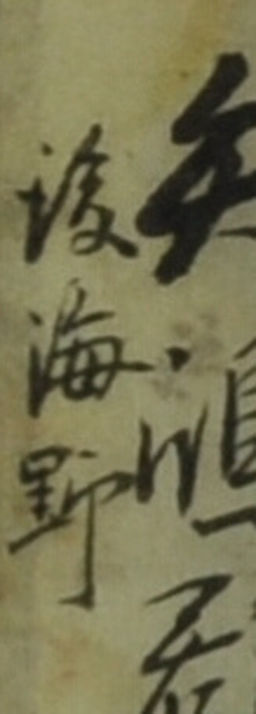後海野

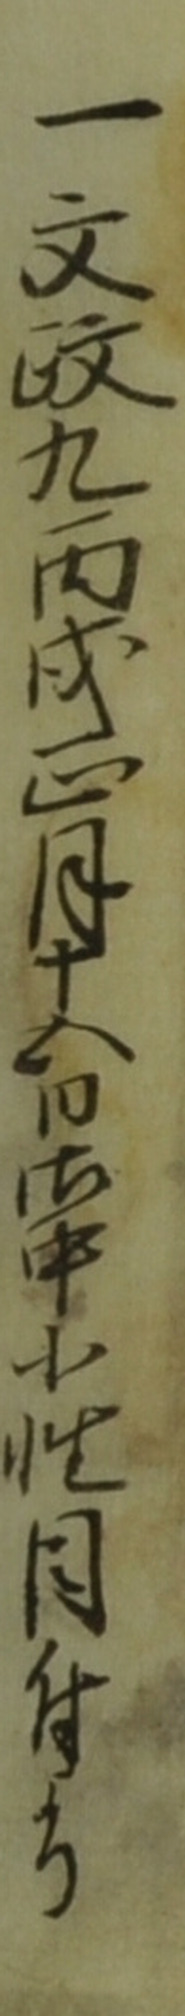一文政九丙戌正月十五日御中小姓目付より
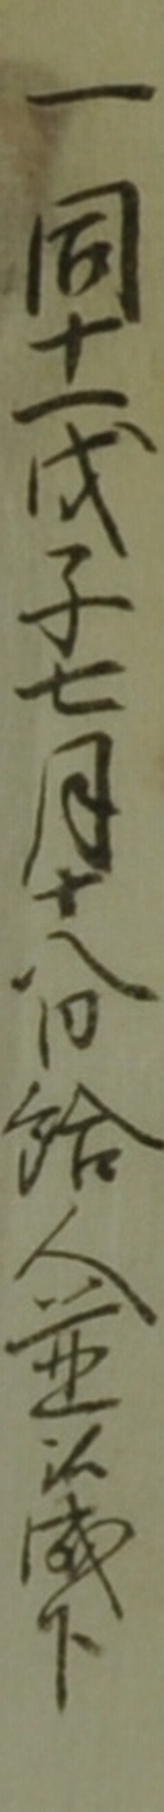一同十一戊子七月十八日給人並被成下
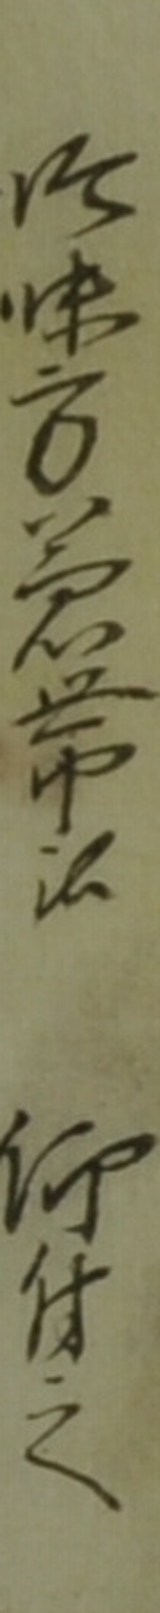吟味方兼帯被仰付之
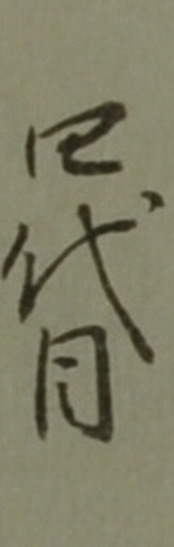四代目
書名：諸御役代々録（八）
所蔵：伊那市立高遠町図書館・合同会社AMANE
